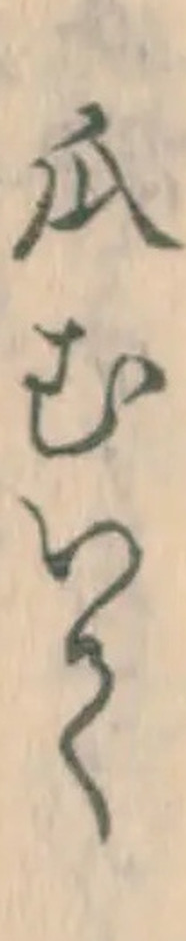瓜むいて
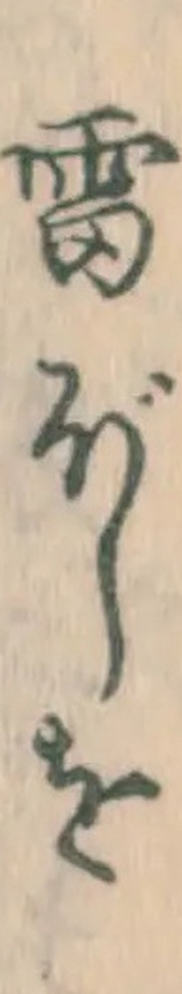雷ぼしを
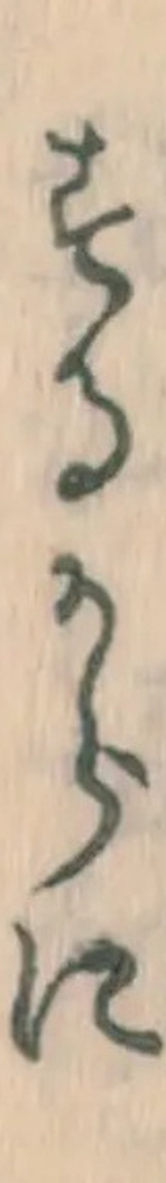するからに
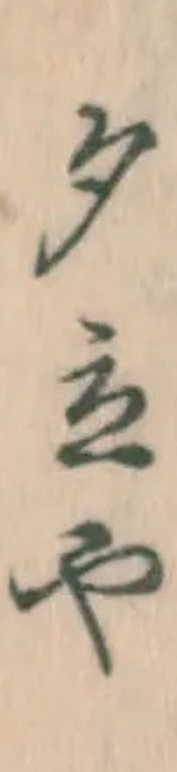夕立や
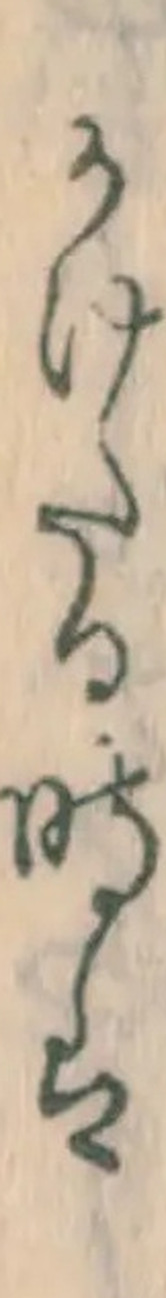かけたる時は
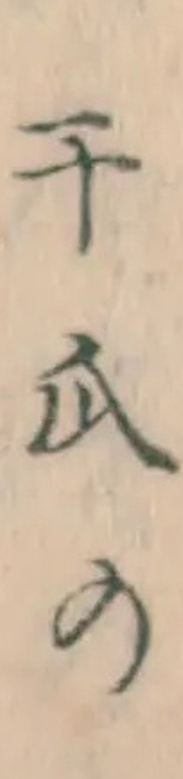干瓜の
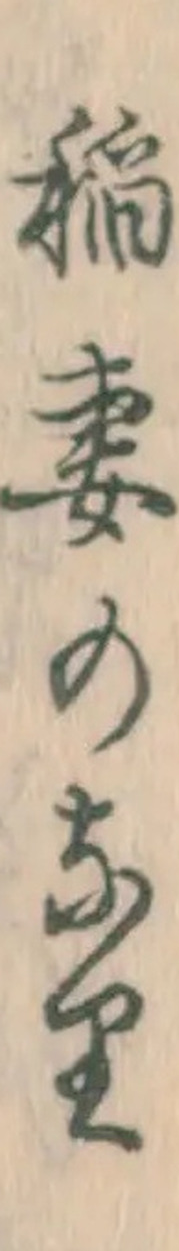稲妻のなり
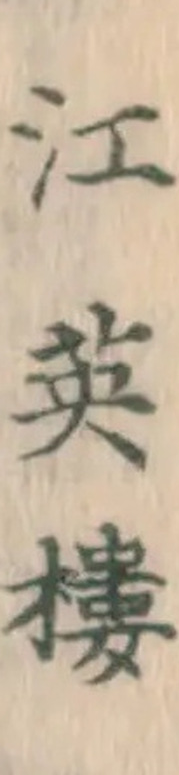江英樓
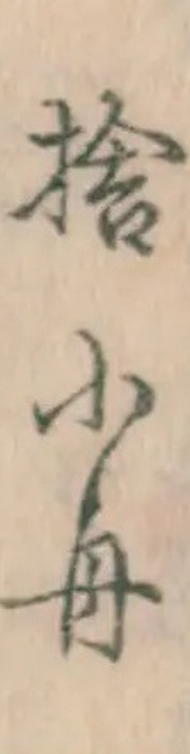捨小舟
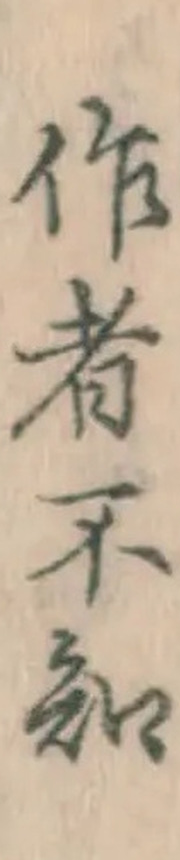作者不知

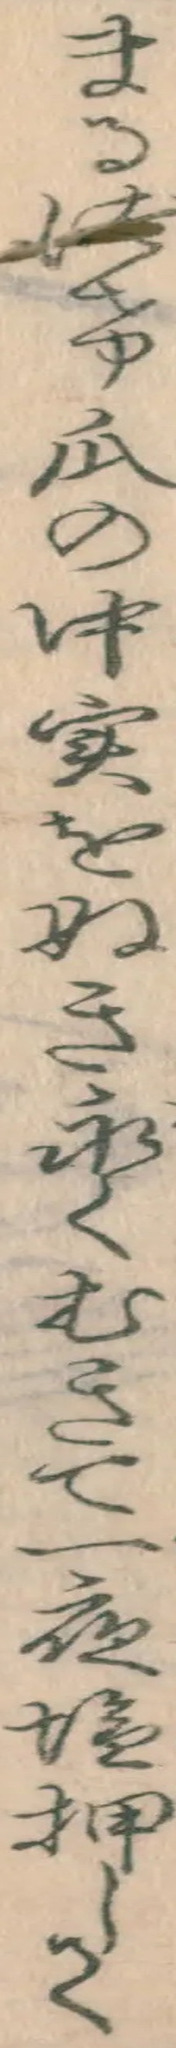まるづけ瓜の中実をぬき永くむきて一夜塩押して
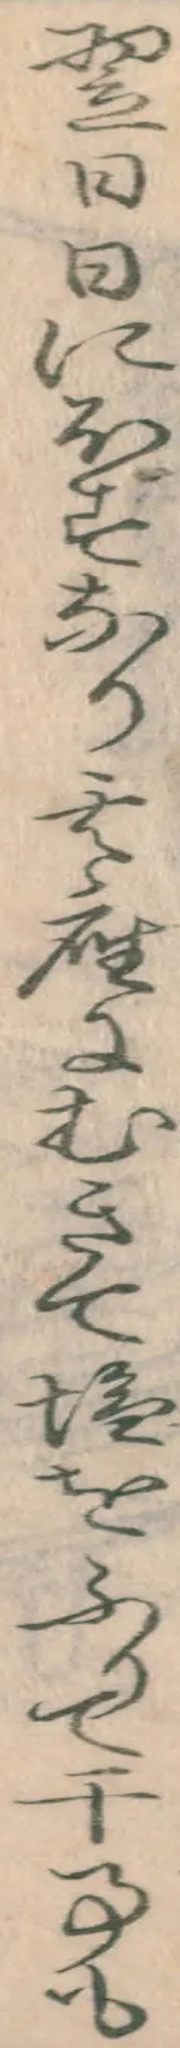翌日日にほすなり其座にむきて塩をふりて干事も
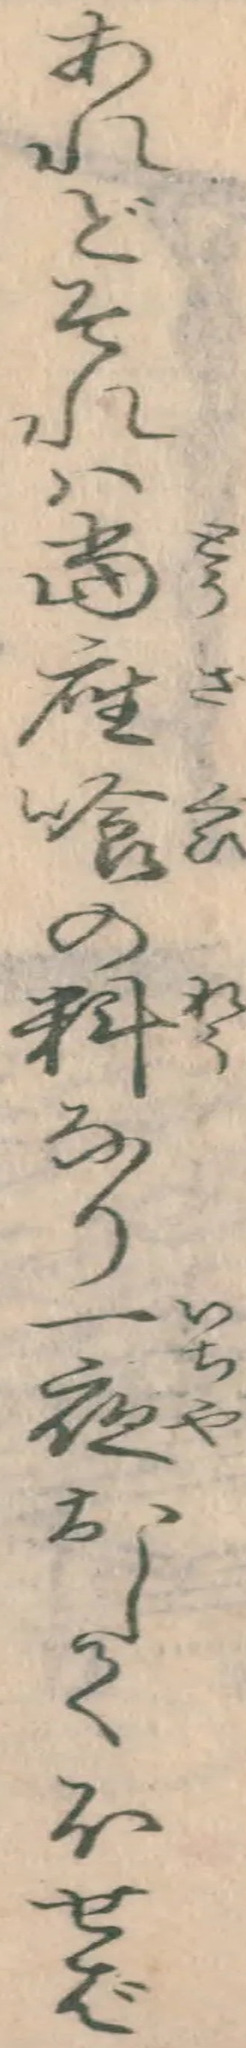あれどそれは当座喰の料なり一夜おしてほせば
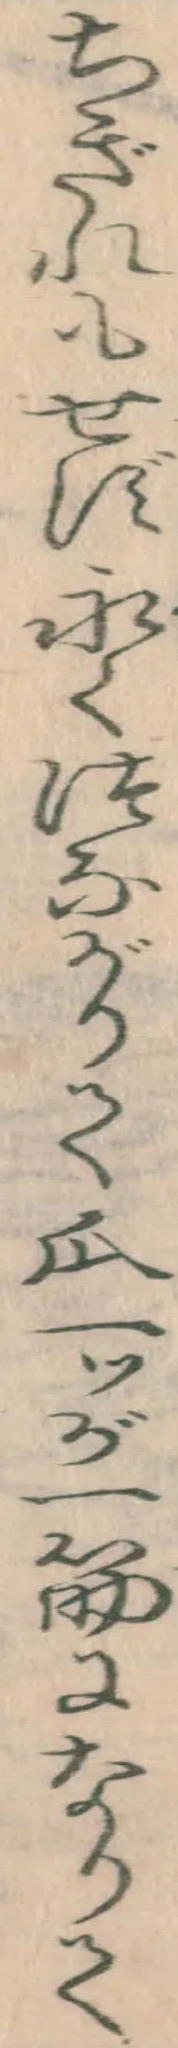ちぎれもせず永くつながりて瓜一ッが一筋になりて
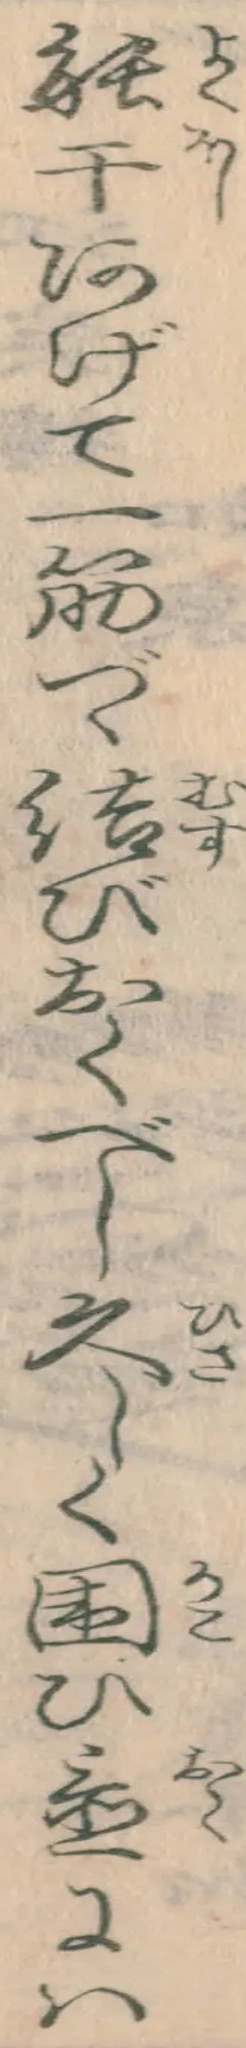能干あげて一筋づゝ結びおくべし久しく囲ひ置には
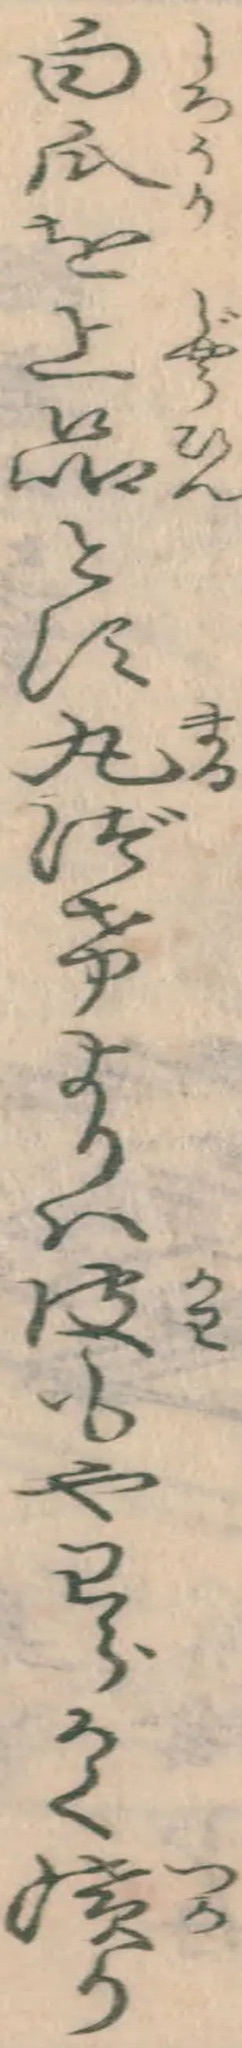白瓜を上品とす丸づけよりは皮もやわらかく漬り
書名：四季漬物鹽嘉言
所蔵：国立国会図書館 National Diet Library, JAPAN
